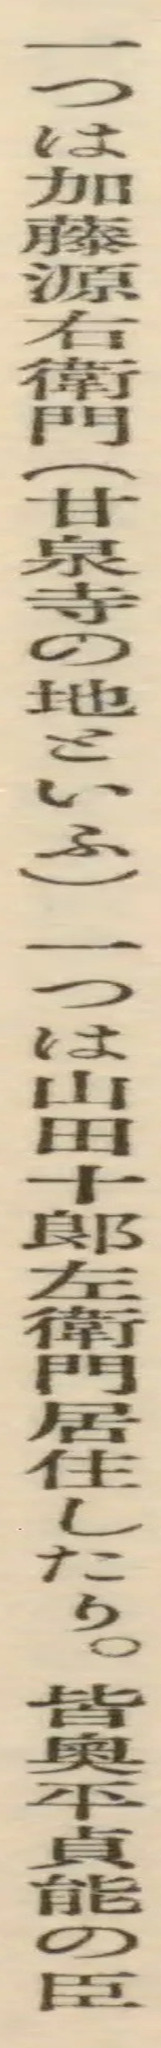一つは加藤源右衛門(甘泉寺の地といふ)一つは山田十郎左衛門居住したり。皆奥平貞能の臣
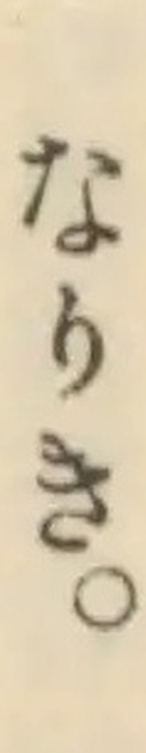なりき。
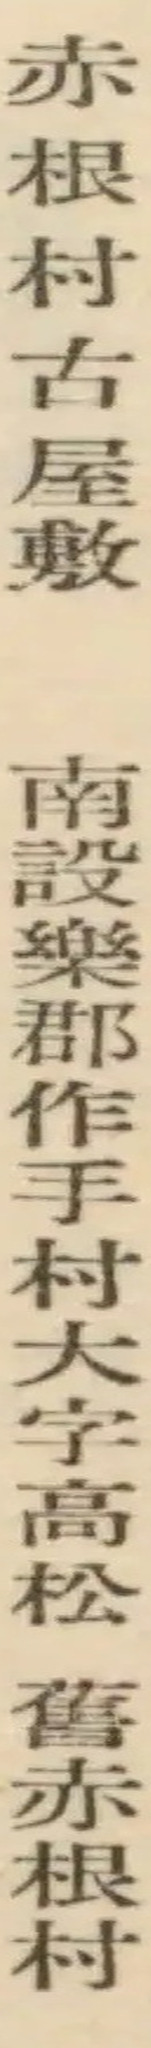赤根村古屋敷南設楽郡作手村大字高松旧赤根村
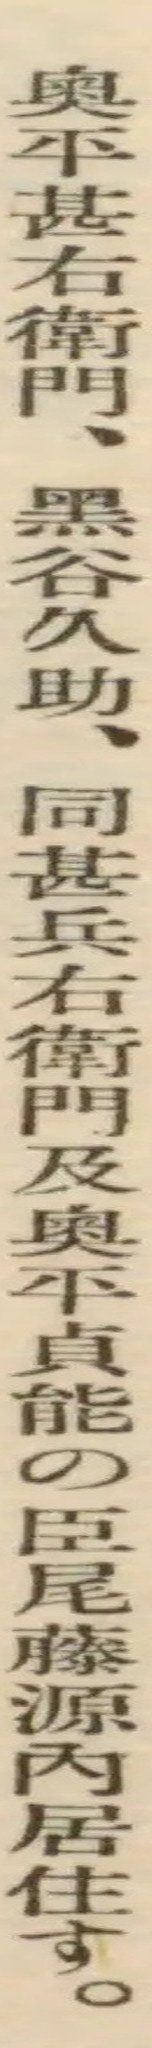奥平甚右衛門、黒谷久助、同甚兵右衛門及奥平貞能の臣尾藤源内居住す。
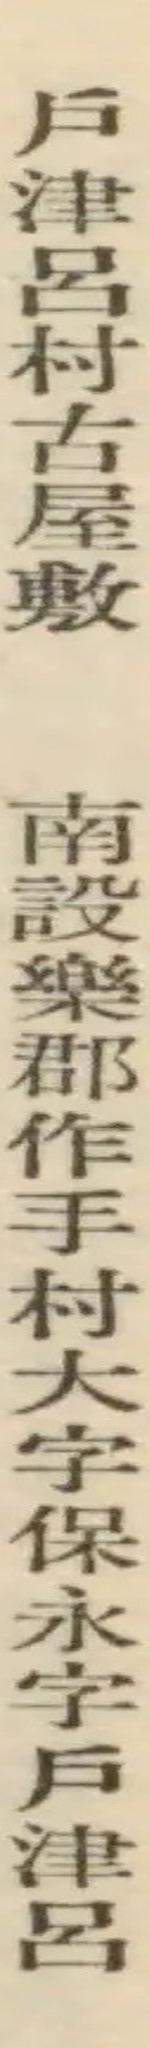戸津呂村古屋敷南設楽郡作手村大字保永字戸津呂
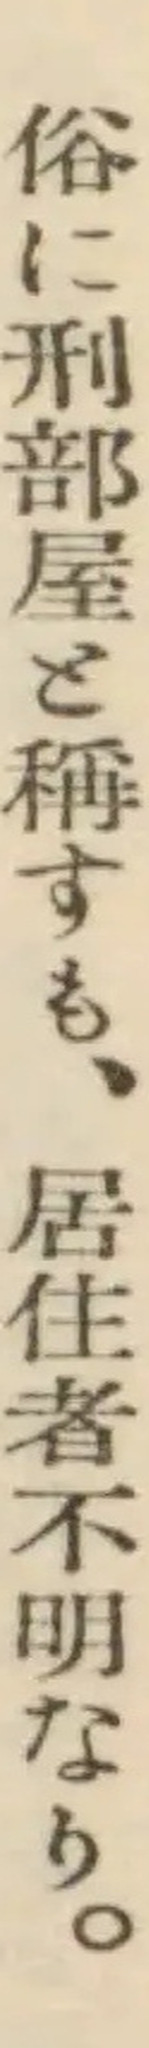俗に刑部屋と称すも、居住者不明なり。
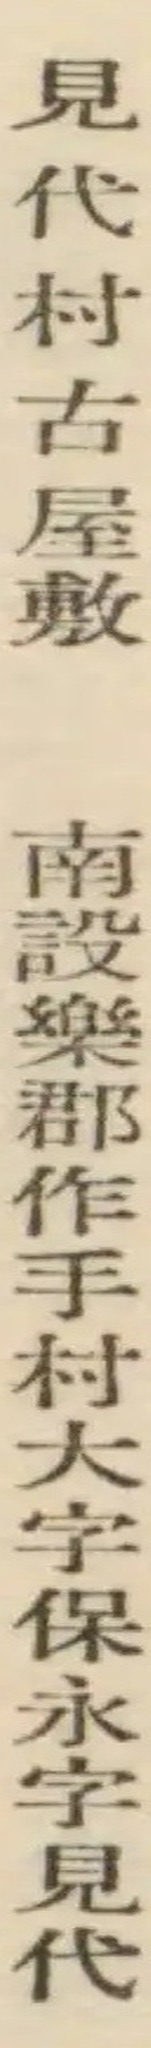見代村古屋敷南設楽郡作手村大字保永字見代
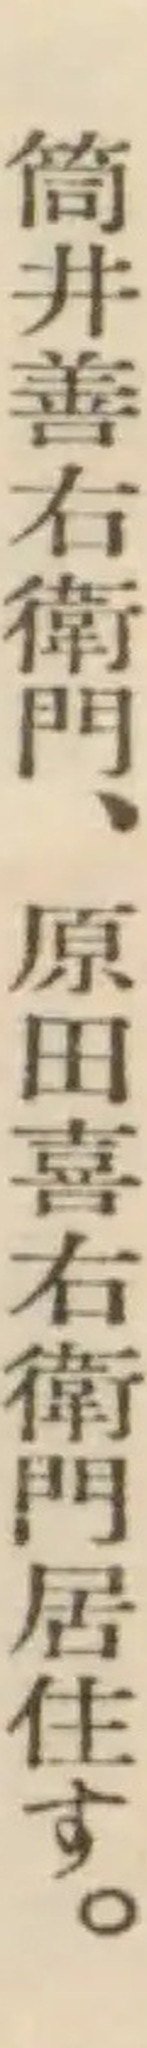筒井善右衛門、原田喜右衛門居住す。
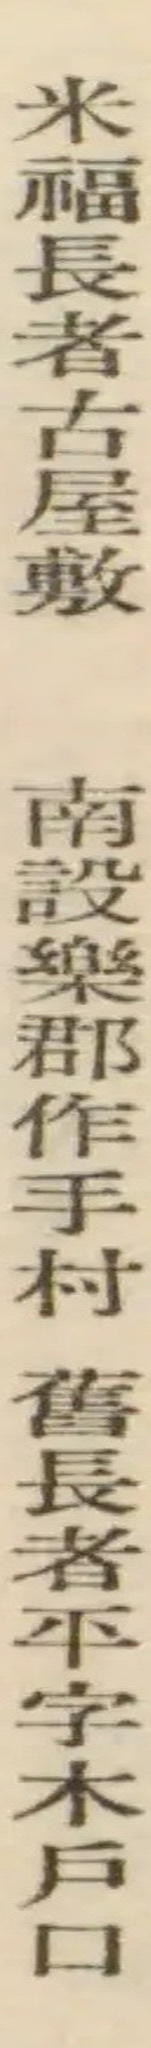米福長者古屋敷南設楽郡作手村旧長者平字木戸口
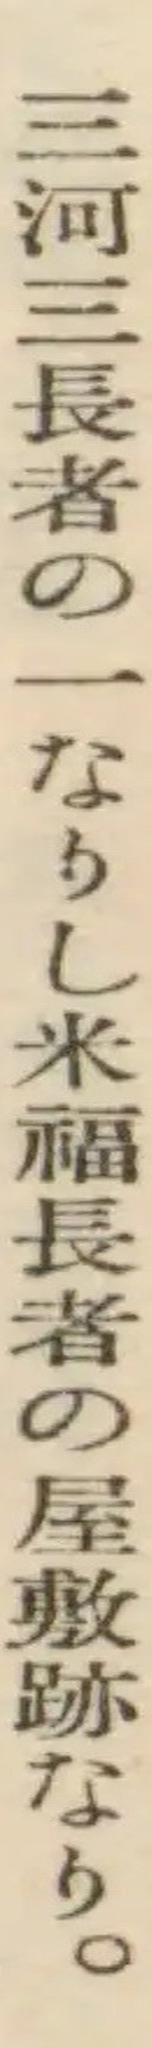三河三長者の一なりし米福長者の屋敷跡なり。
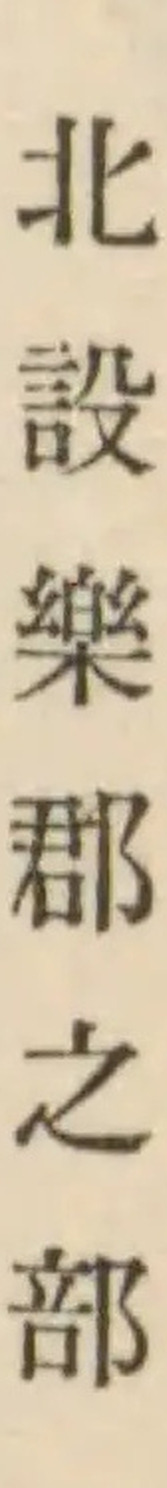北設楽郡之部
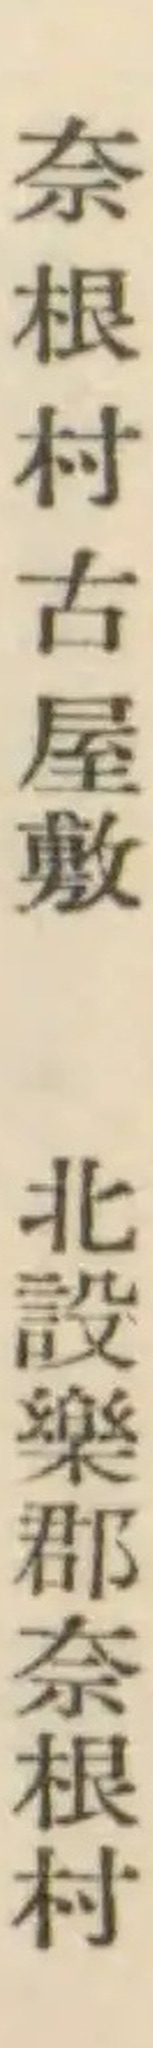奈根村古屋敷北設楽郡奈根村
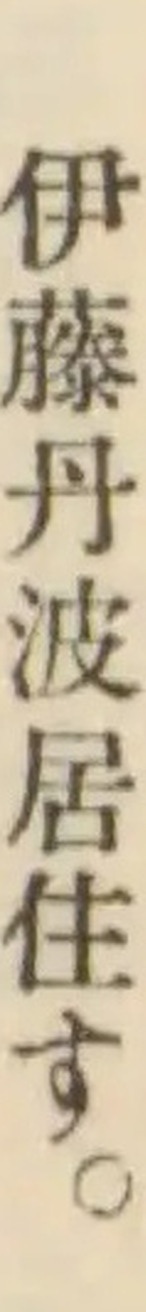伊藤丹波居住す。
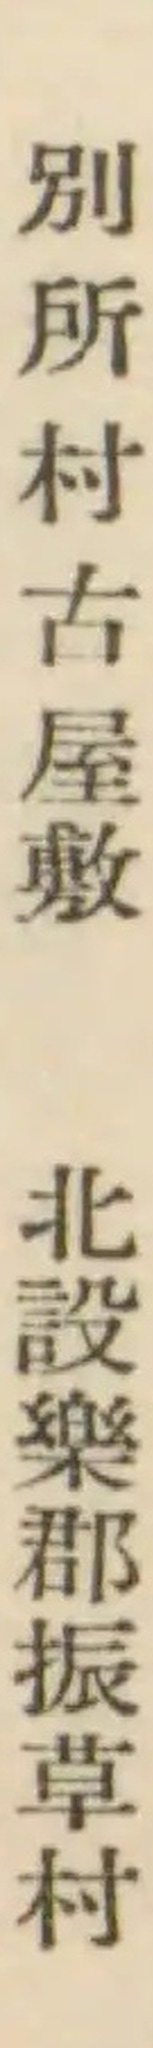別所村古屋敷北設楽郡振草村
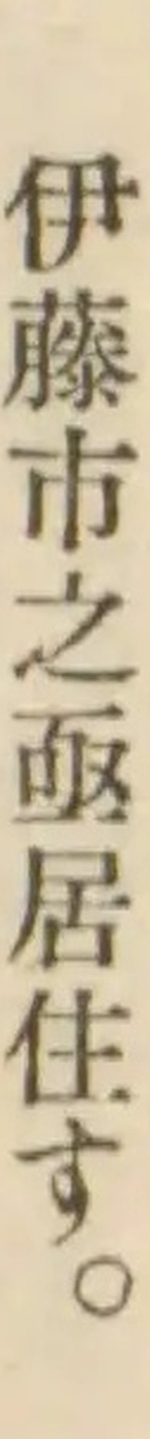伊藤市之亟居住す。

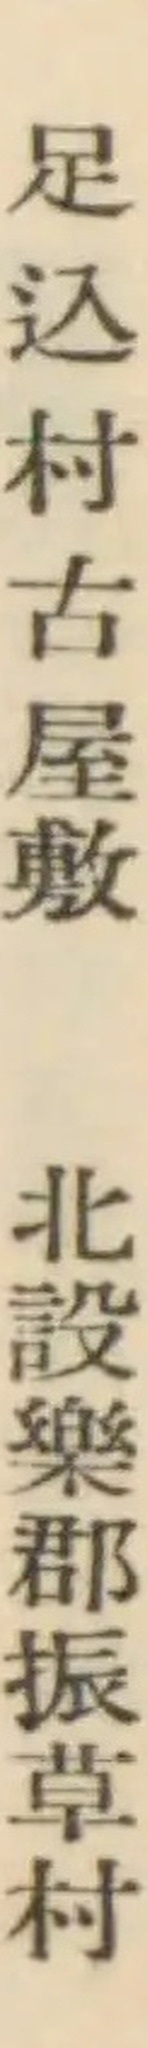足込村古屋敷北設楽郡振草村
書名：東三河之古城
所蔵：国立国会図書館 National Diet Library, JAPAN
